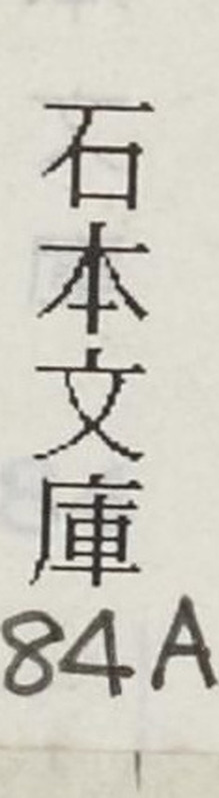石本文庫

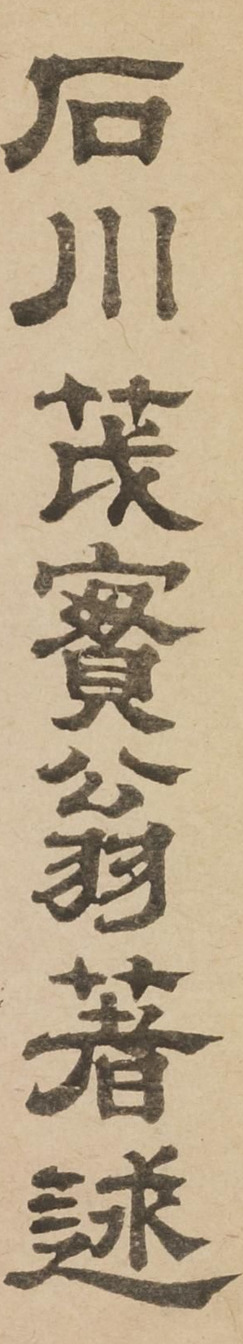石川茂實翁著述
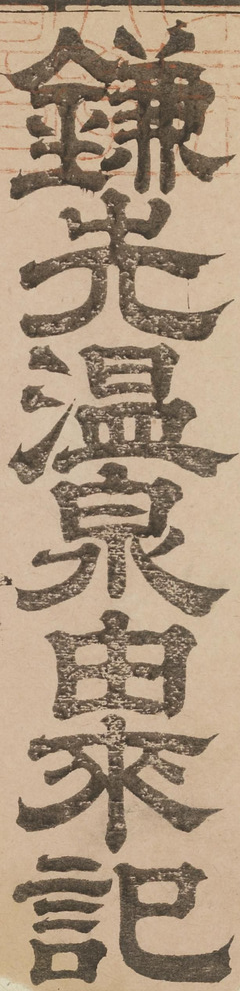鎌先温泉由来記
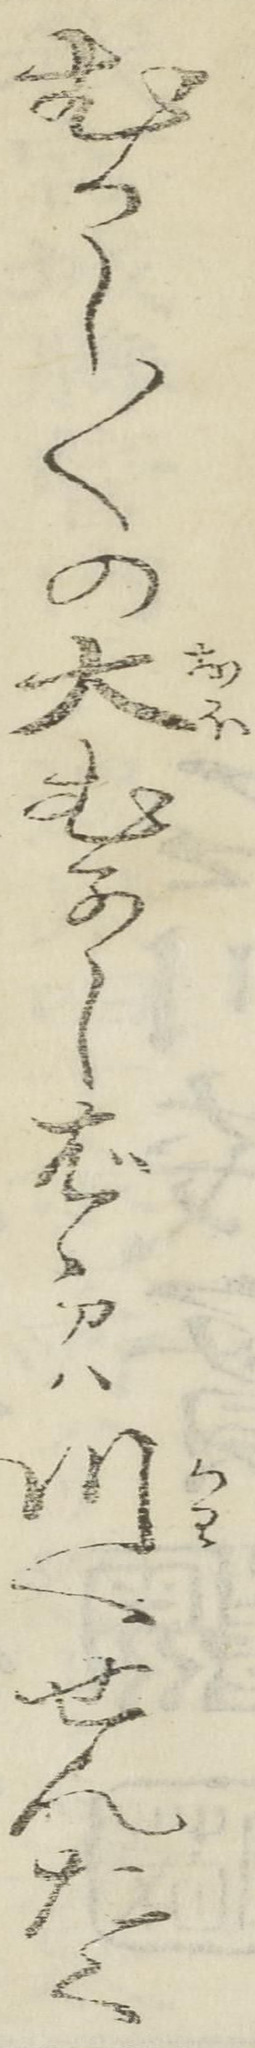むかし〳〵の大むかしばゝアハ川へせんたく
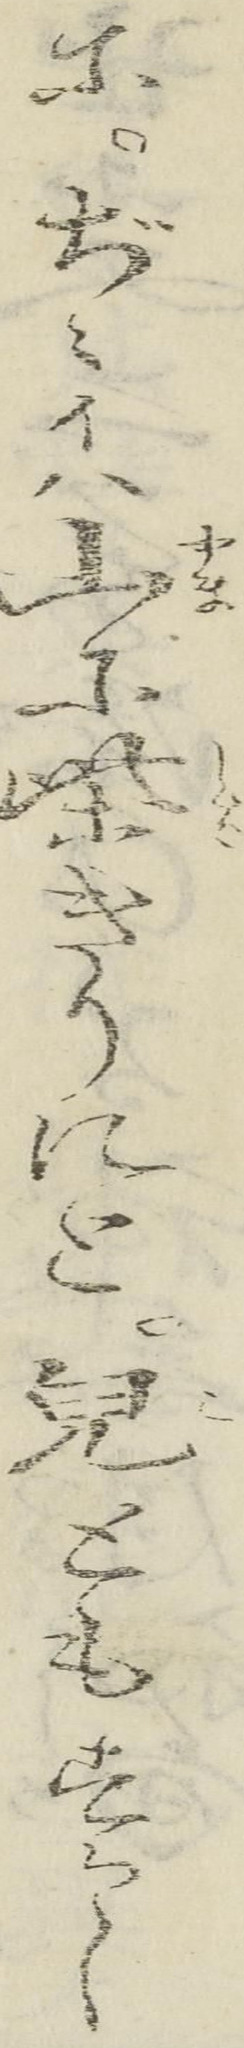に。ぢゝイハ山に柴きりにと。児ともすら〳〵
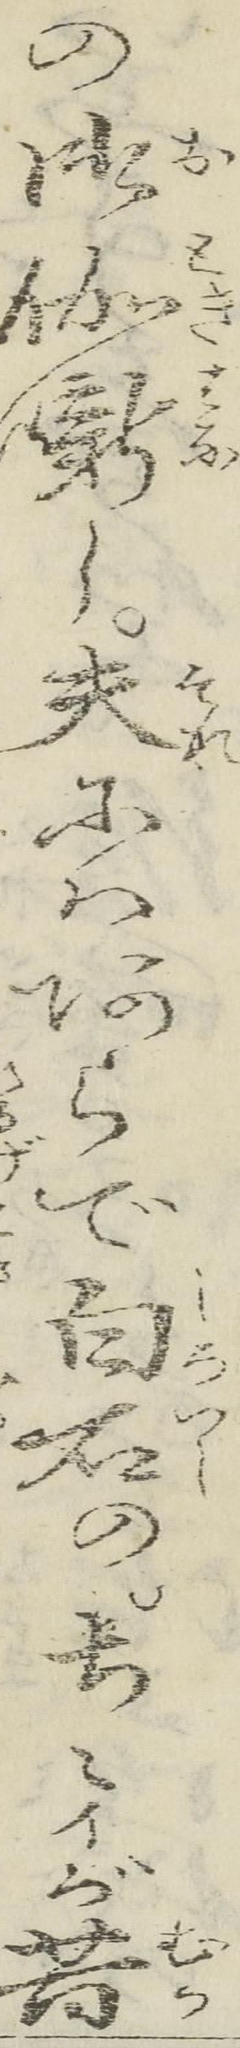の御伽噺し。夫にハあらで白石の。ちゝイが昔
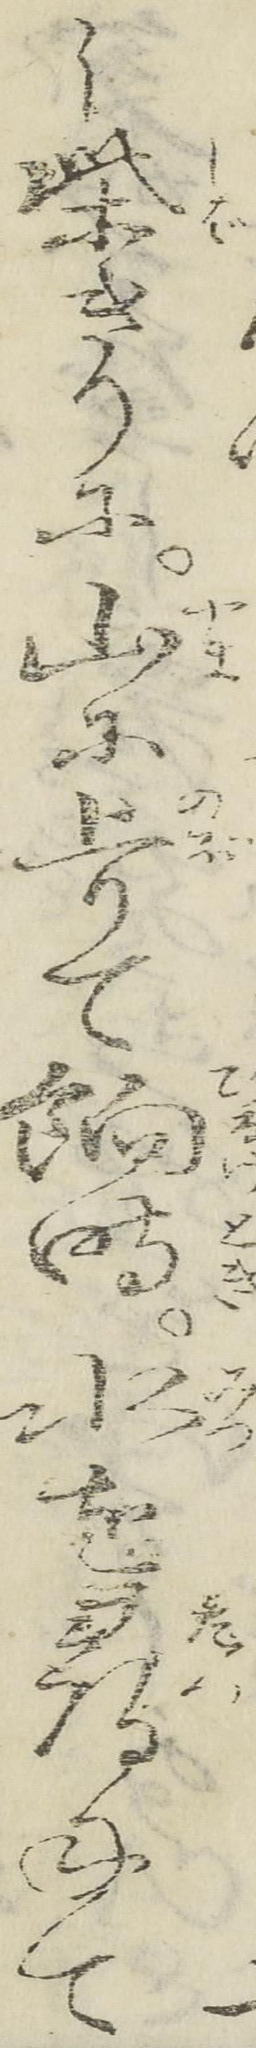し柴きりに。山に上りて餉時。水を尋ねて
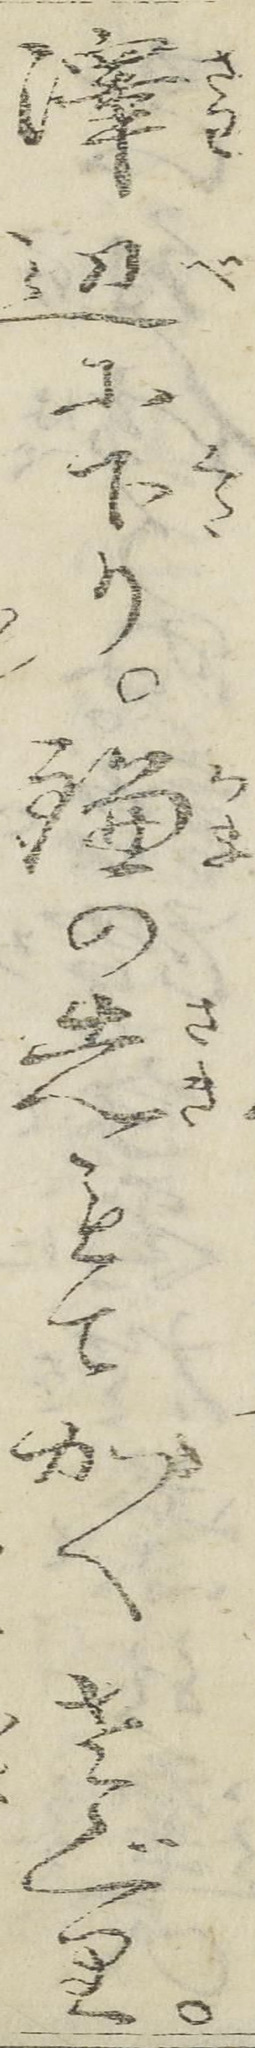澤辺に下り。鎌の先もてかくさぐり。
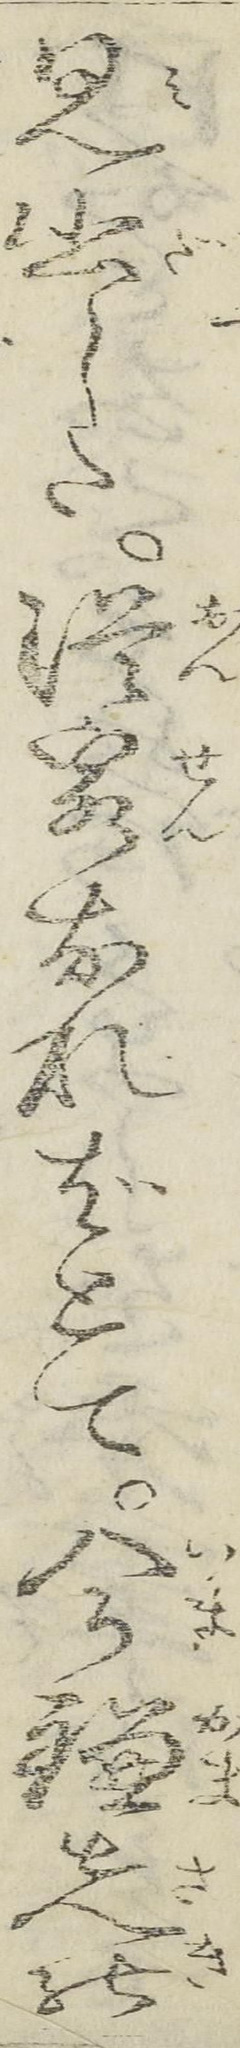見出した。温泉なればとて。今鎌先の
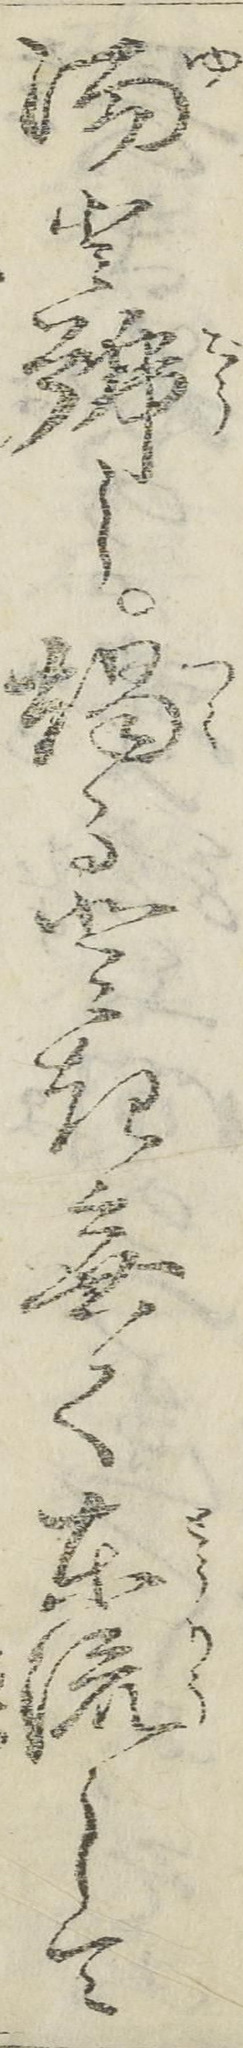湯と號し。竭るとき無く東流して
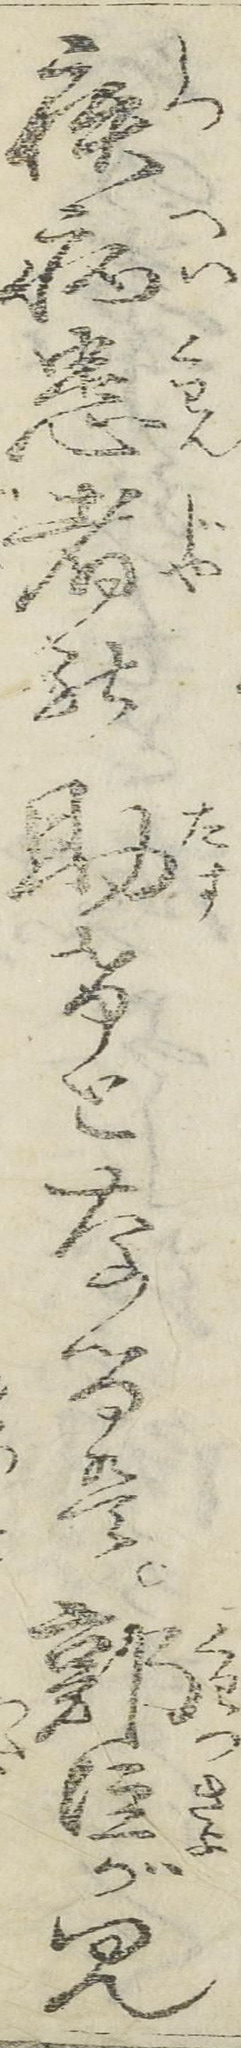疾病患者の助けとなるは。郭巨が見
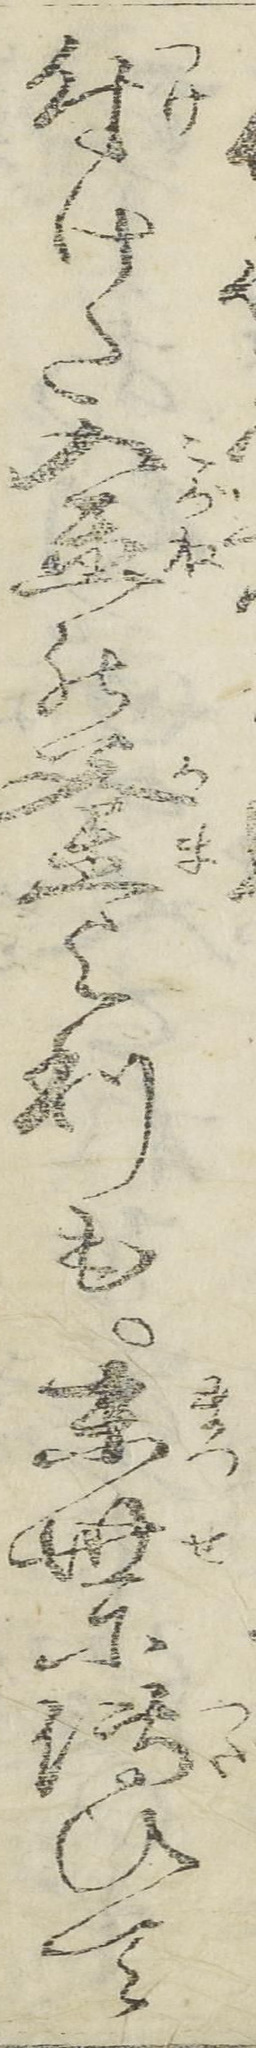付けた金の釜よりも。末世に伝ひて

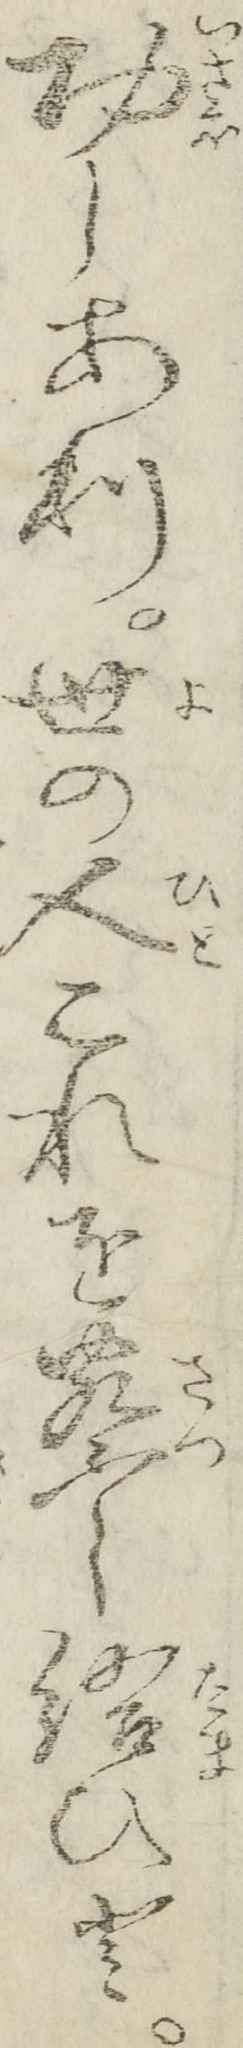功しあり。世の人これを察し給ひと。
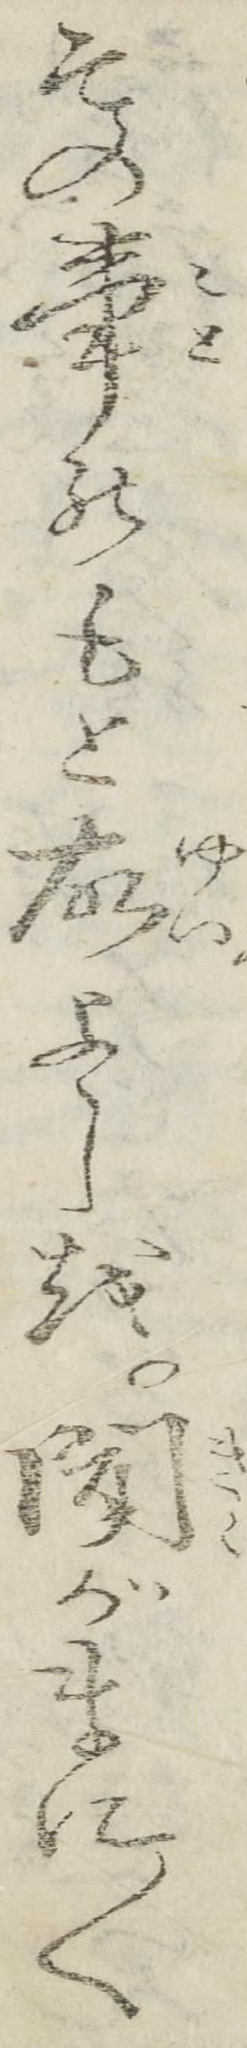その事のもと故よしを。聞がまに〳〵
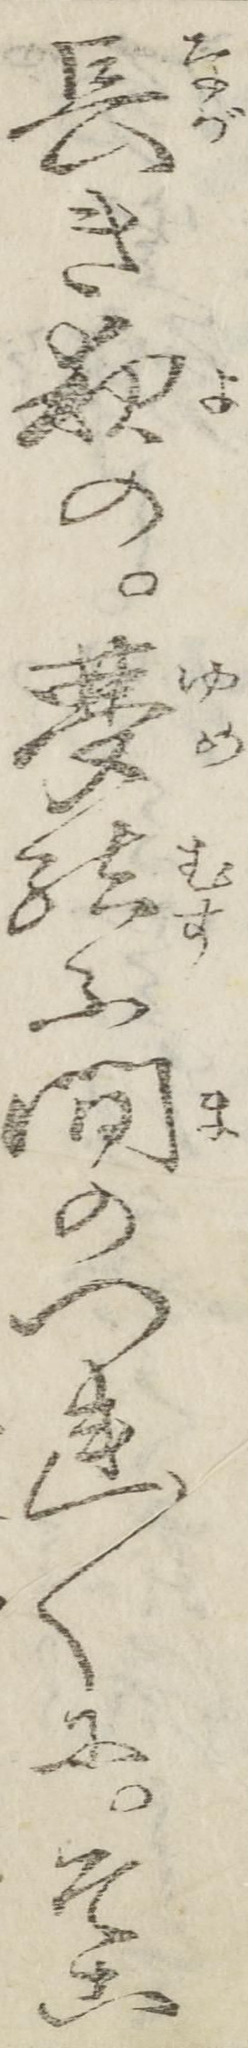長き夜の。夢結ふ間のつれ〳〵に。そこ
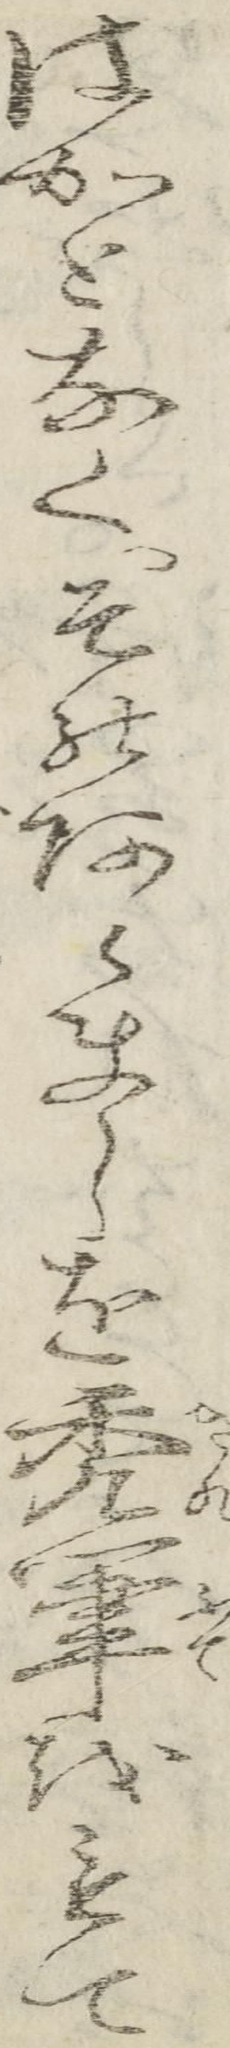はかとなく。そのあらましを禿筆をもて
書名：鎌先温泉由來記
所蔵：東京大学地震研究所図書室 Earthquake Research Institute Library, The University of Tokyo, JAPAN
